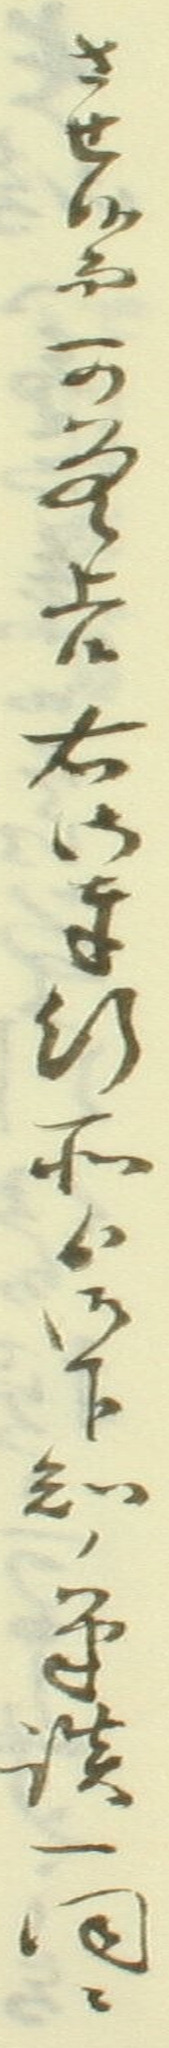させ候而可差上候右御奉行所ゟ御下知ノ筆談一同に
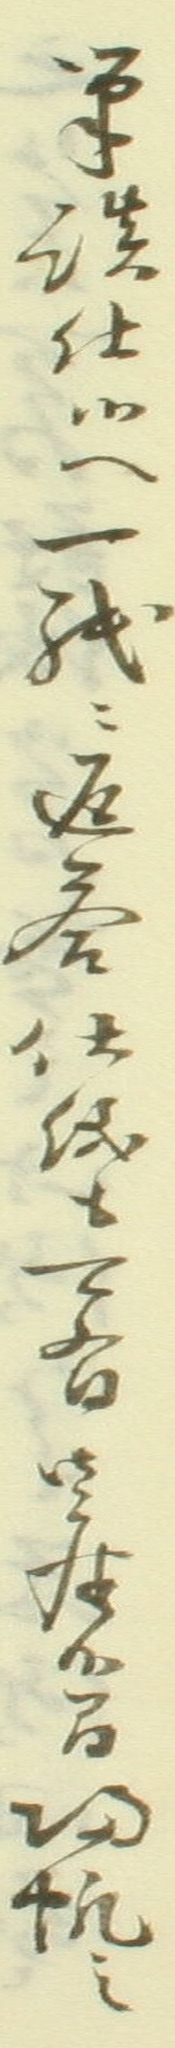筆談仕候へ一紙に返答仕儀も可有御座候間帰帆之
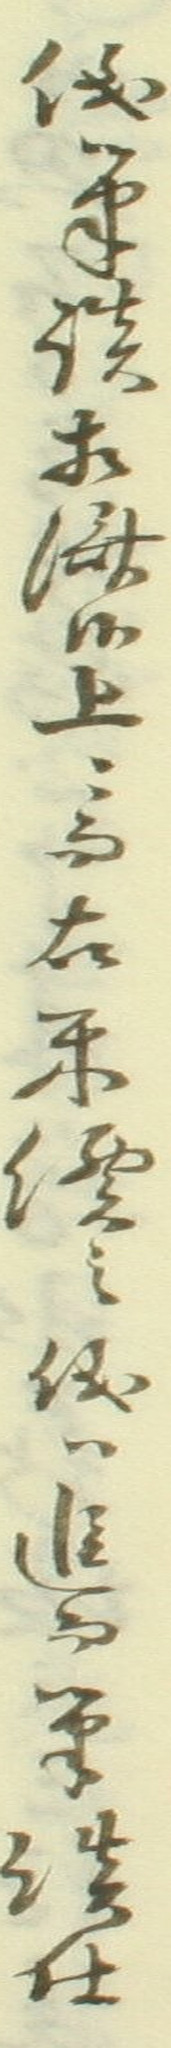儀筆談相済候上に而右米価之儀は追而筆談仕
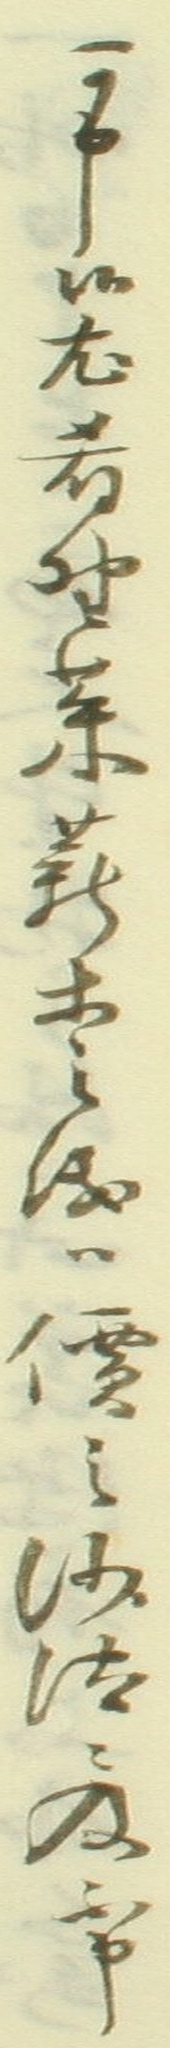可申候尤肴野菜薪等之儀は価之沙汰に及不申
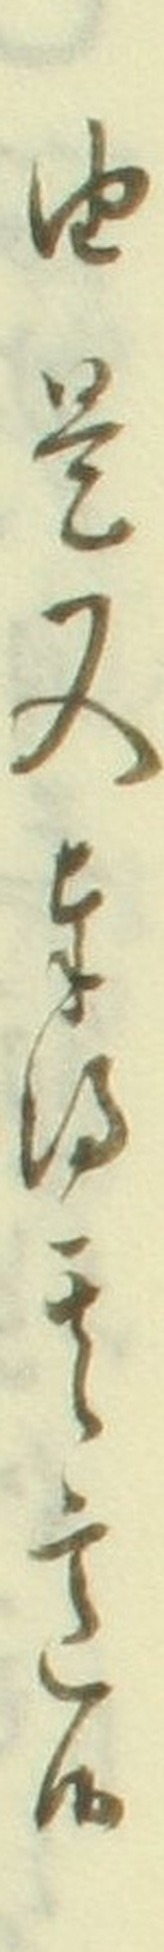由是又奉得其意候
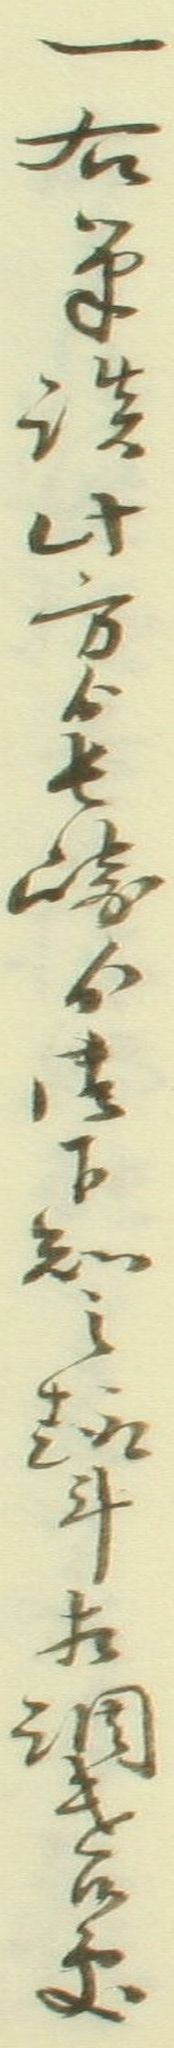一右筆談此方ゟ長崎ゟ御下知之趣計相調遣候処
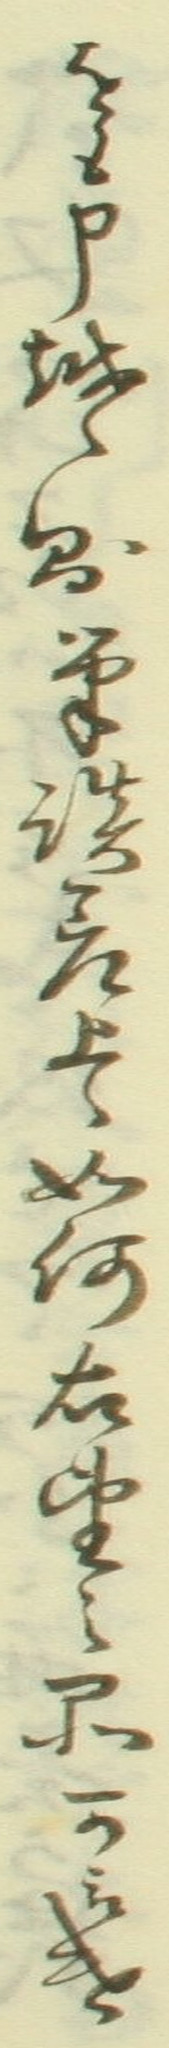をも申越候則筆談差上候如何右望之品可被遣

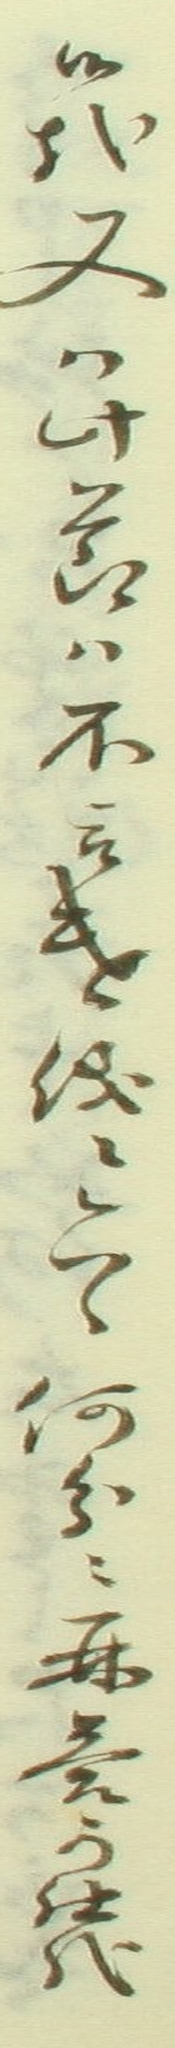候哉又は此節は不被遣儀に候はゝ何分に再答可仕哉
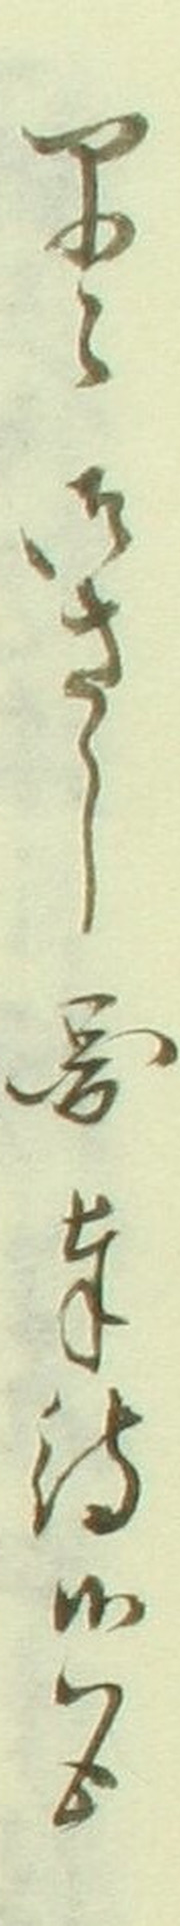早々御さし図奉待候以上
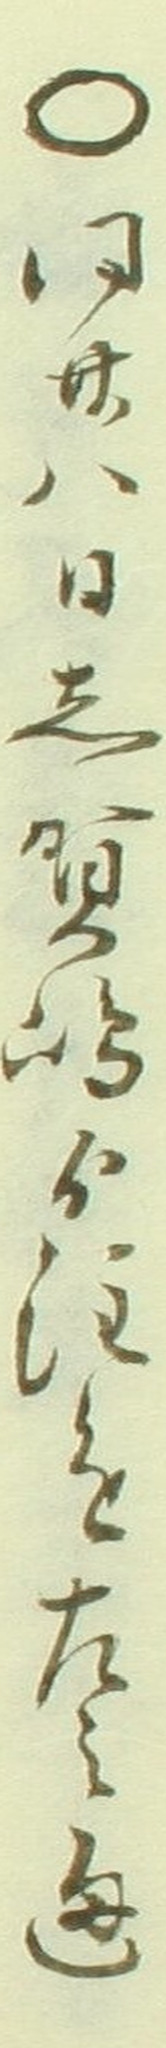〇同廿八日志賀島ゟ注進左之通
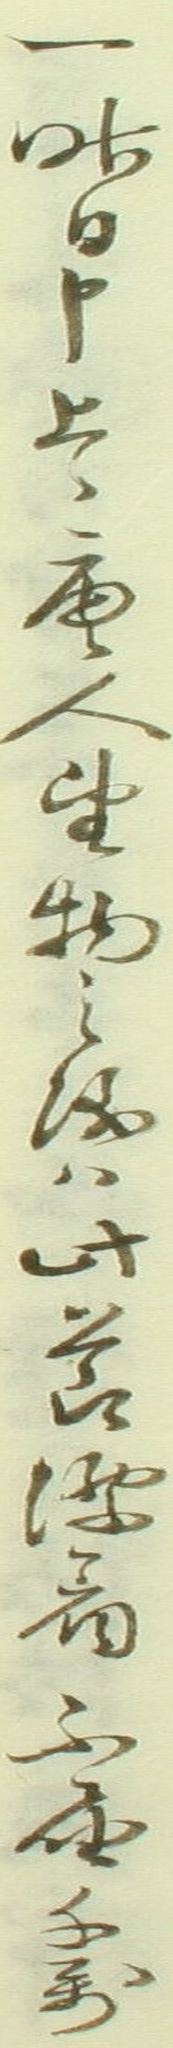一昨日申上候唐人望物之儀は此節漂着不届千万
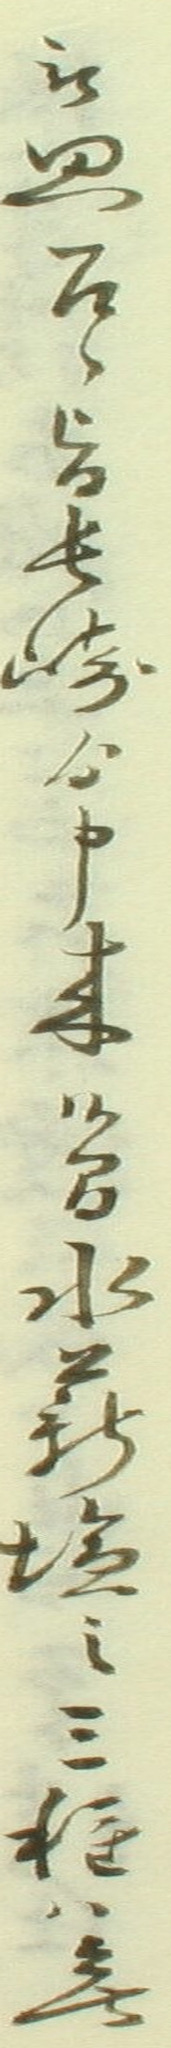被思召候旨長崎ゟ申来候間水薪塩之三種は無
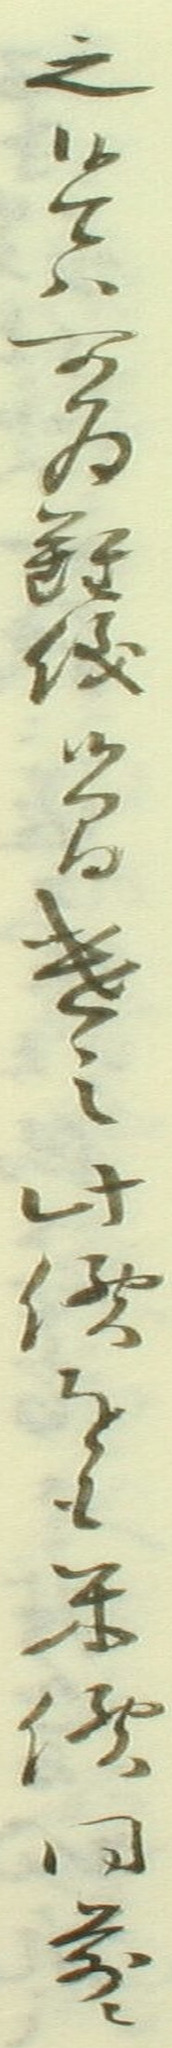之候ては可為難義候間遣之此価をも米価同前に
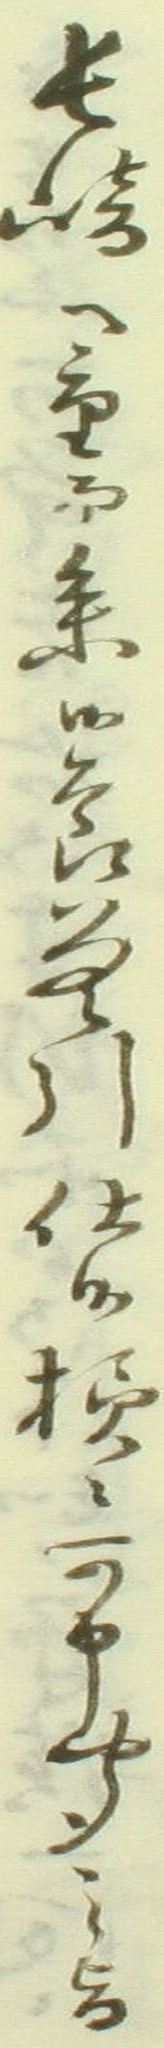長崎へ重而参候節差引仕候様に可申聞之旨
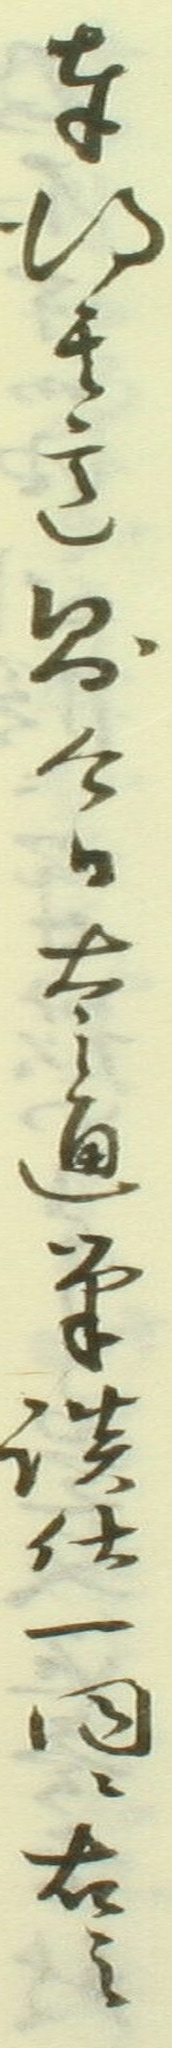奉得其意則今日右之通筆談仕一同に右之
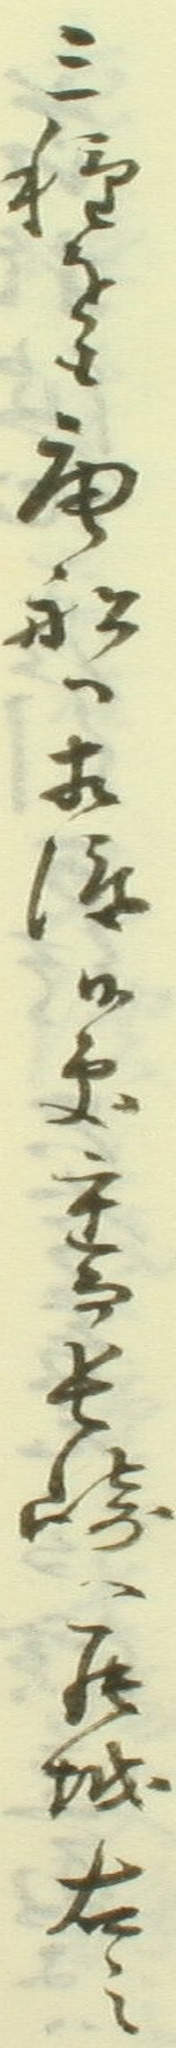三種をも唐船へ相添候処重而長崎へ罷越右之
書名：異国船漂着記
